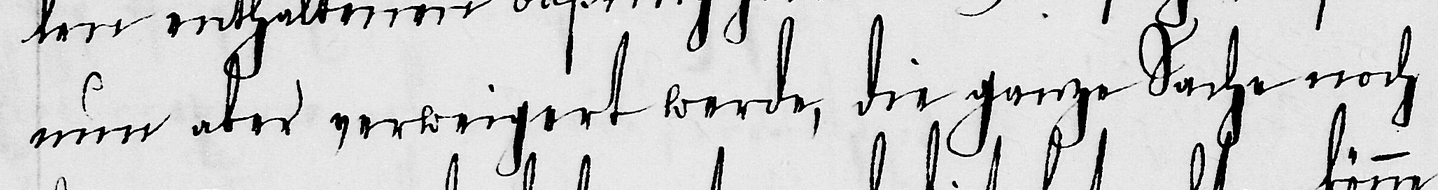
nun aber verweigert werde, die ganze Sache noch
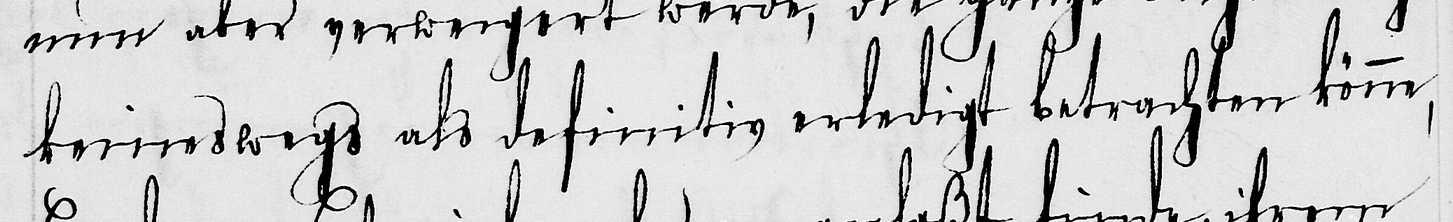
keineswegs als definitiv erledigt betrachten könn¬
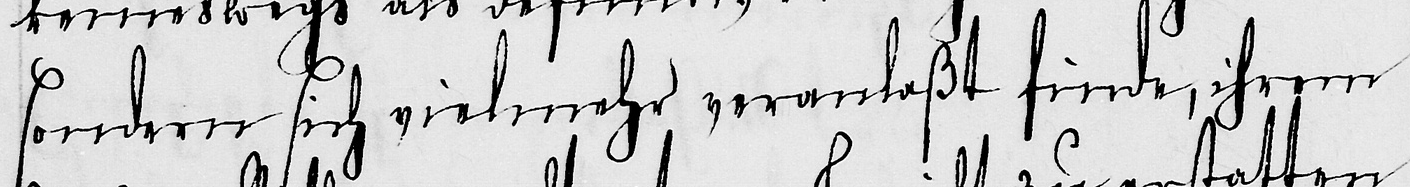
sondern vielmehr veranlaßt finde, ihrem
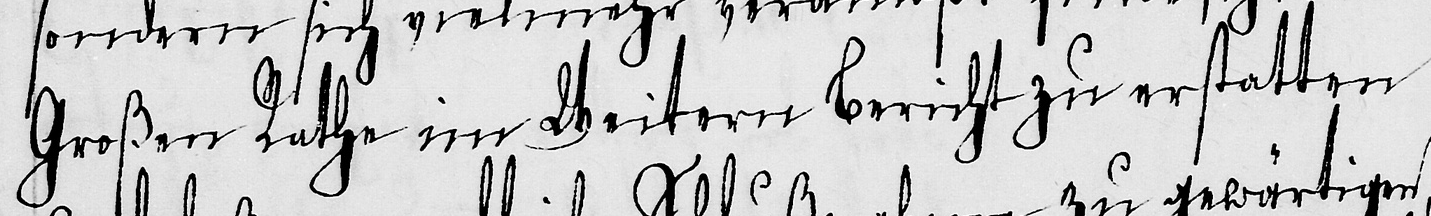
Großen Rathe im Weitern Bericht zu erstatten
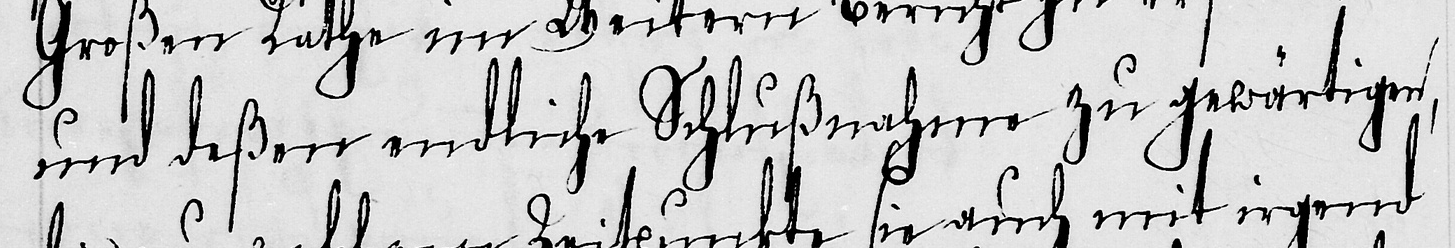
und deßen endliche Schlußnahme zu gewärtigen,
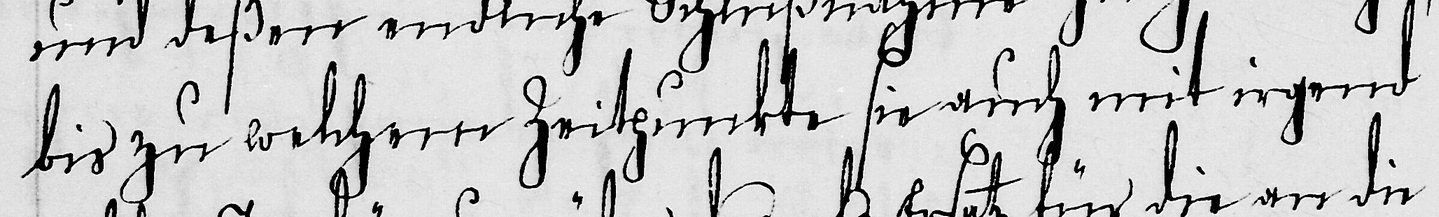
bis zu welchem Zeitpunkte sie auch mit irgend
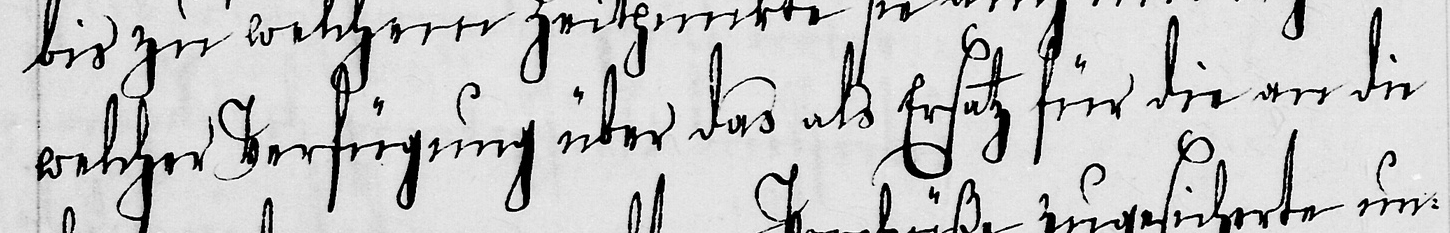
welcher Verfügung über das als Ersatz für die an die
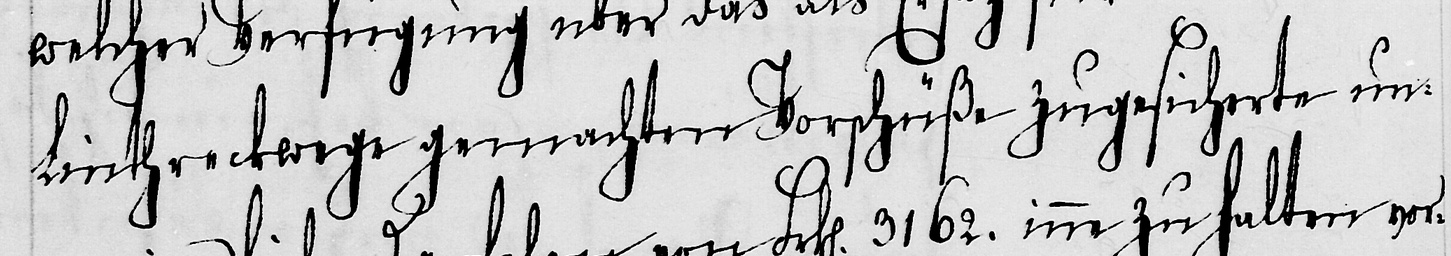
Linthreckwege gemachten Vorschüße zugesicherte un¬
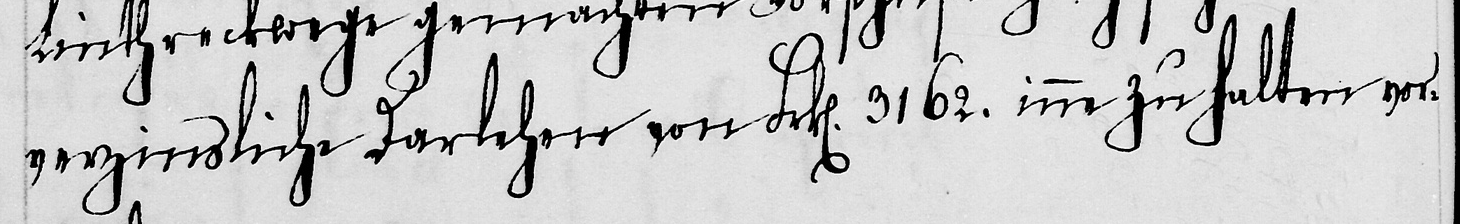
verzinsliche Darlehen von Frk[en]. 3162. innezuhalten vor¬
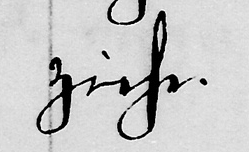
ziehe.
